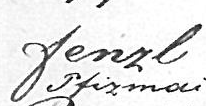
Fenzl
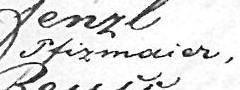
Pfizmaier
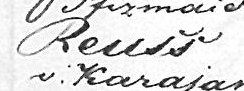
Reuss
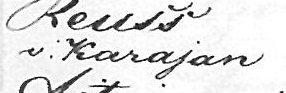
v. Karajan
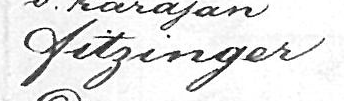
Fitzinger
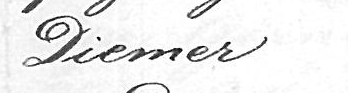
Diemer
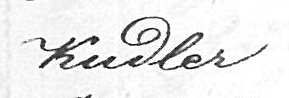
Kudler
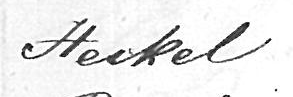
Heckel
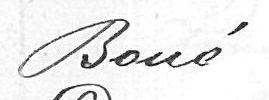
Boué
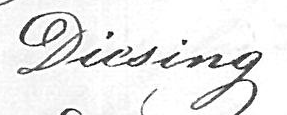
Diesing
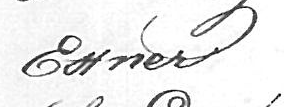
Exner
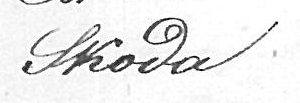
Skoda
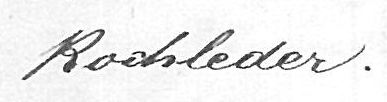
Rochleder.
